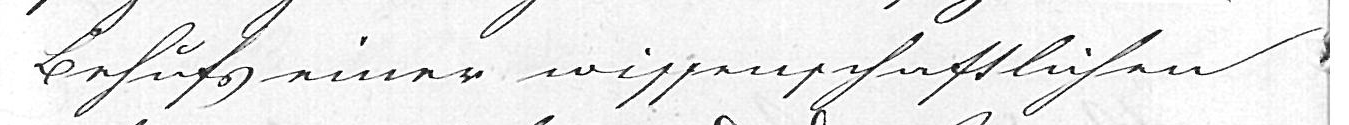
Behufs einer wissenschaftlichen
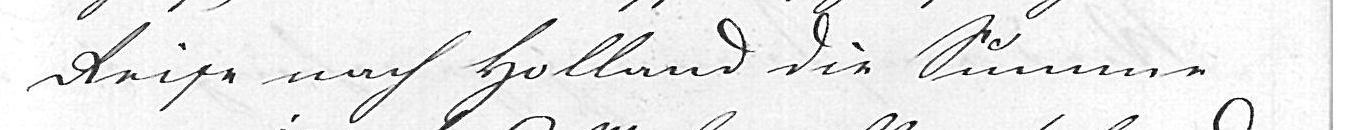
Reise nach Holland die Summe
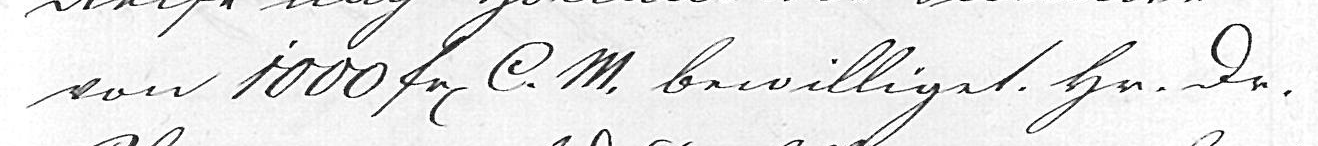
von 1000 fl C.M. bewilliget. Hr. Dr.
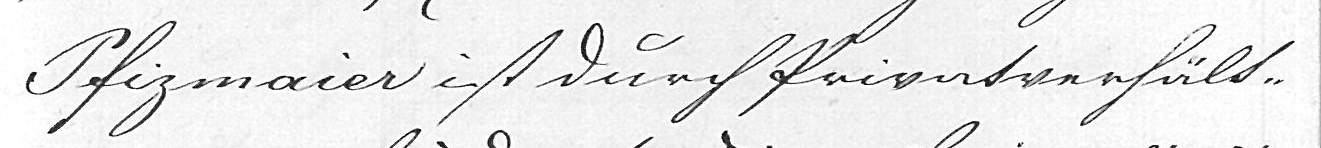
Pfizmaier ist durch Privatverhält-
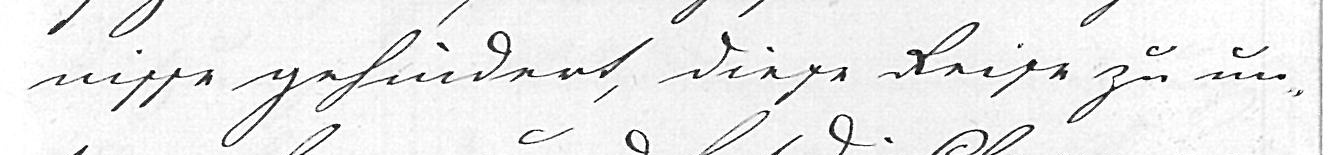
nisse gehindert, diese Reise zu un-
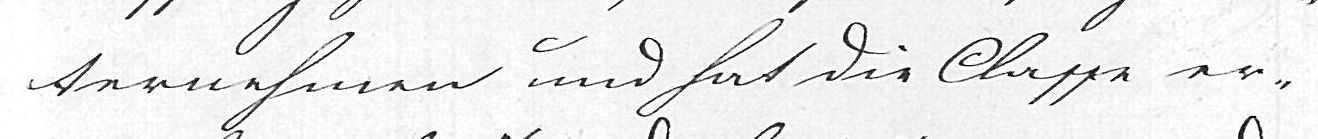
ternehmen und hat die Classe er-
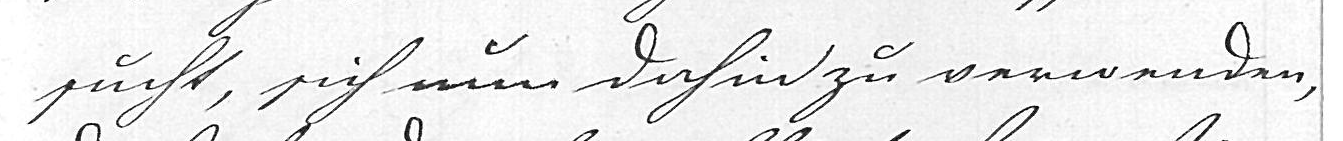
sucht, sich nun dahin zu verwenden,
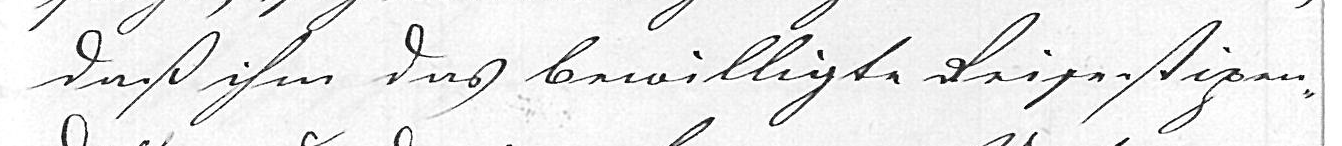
daß ihm das bewilligte Reisestipen-
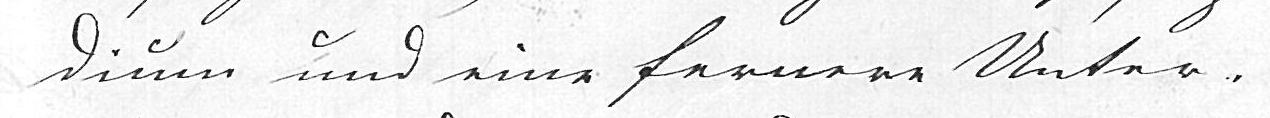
dium und eine fernere Unter-
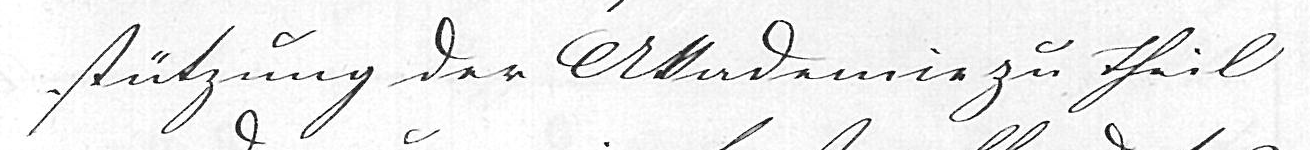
stützung der Akademie zu Theil
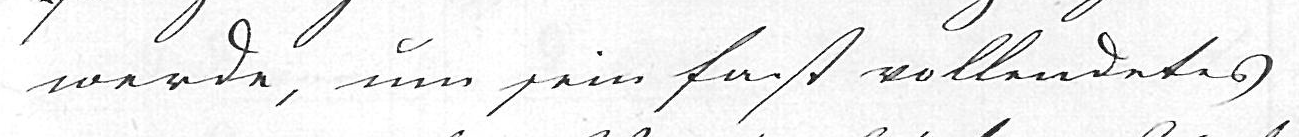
werde, um sein fast vollendetes
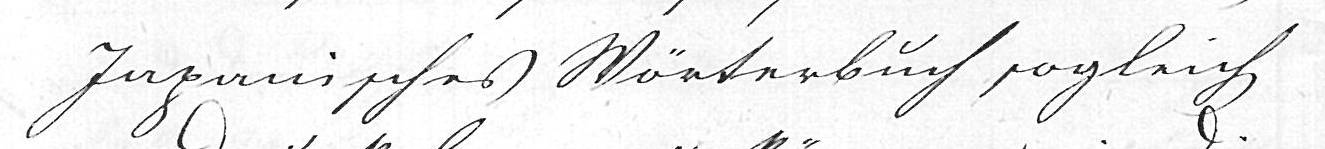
japanisches Wörterbuch sogleich
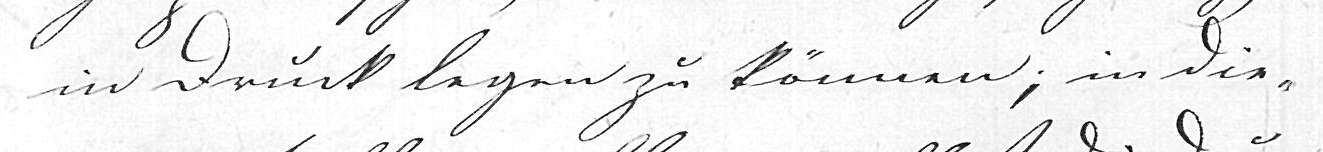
in Druck legen zu können; in die-
